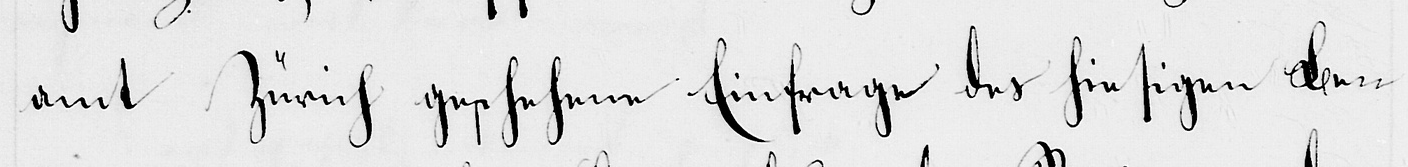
amt Zürich geschehene Einfrage des hiesigen Be¬
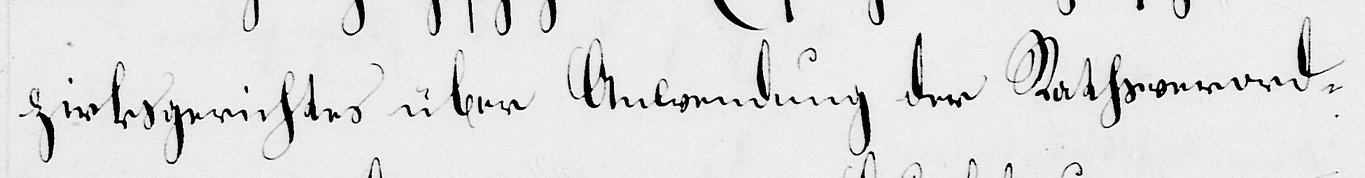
zirksgerichtes über Anwendung der Rathsverord¬
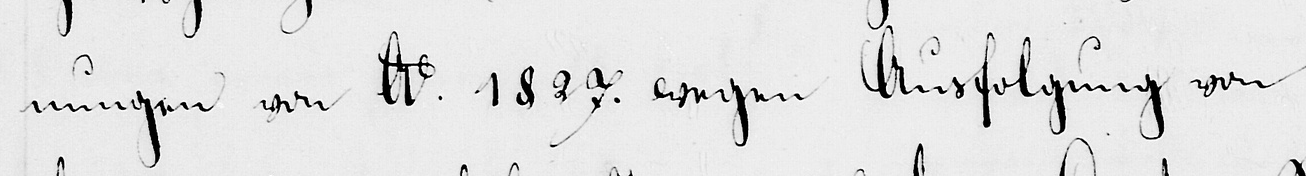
nungen von A°. 1827. wegen Ausfolgung von
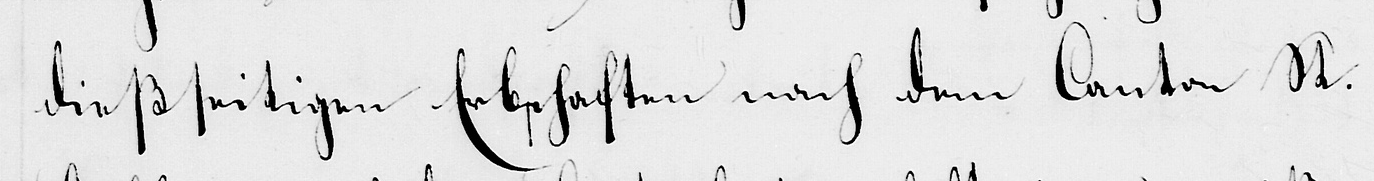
dießseitigen Erbschaften nach dem Canton St.
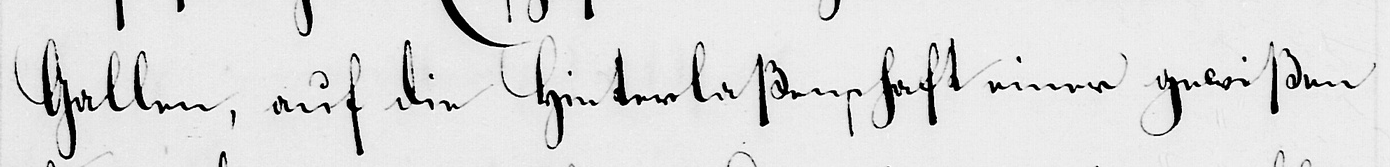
Gallen, auf die Hinterlaßenschaft einer gewißen
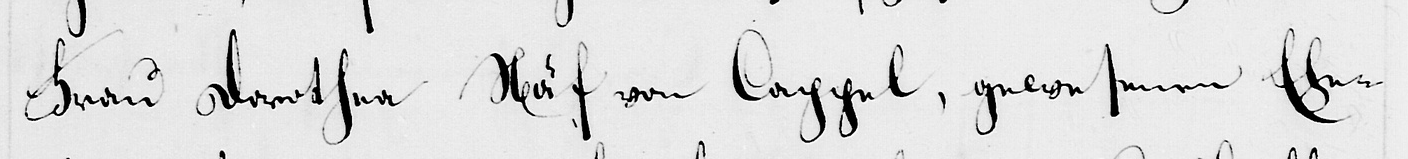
Frau Dorothea Näf von Cappel, gewesene Ehe¬
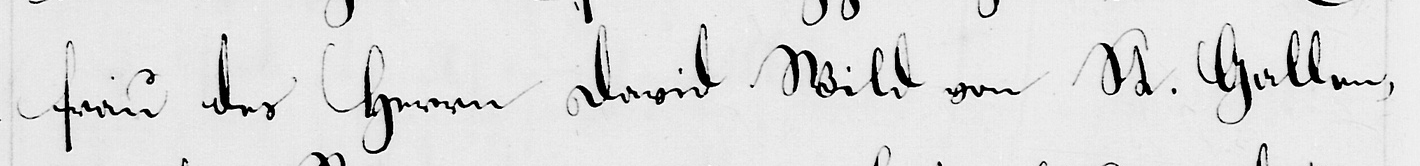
frau des Herrn David Wild von St. Gallen,
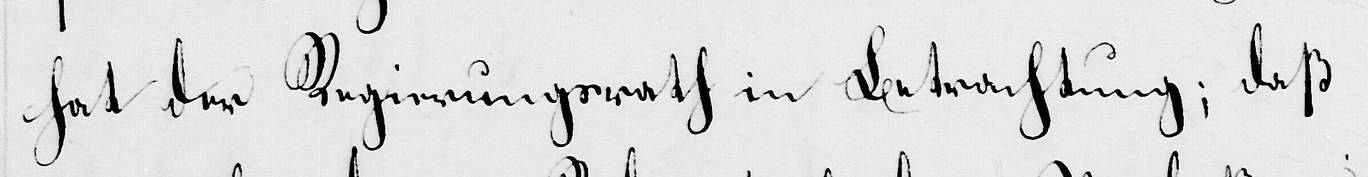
hat der Regierungsrath in Betrachtung; daß
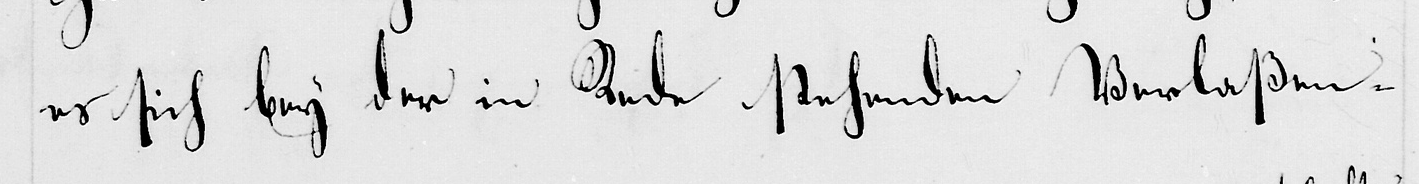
es sich bey der in Rede stehenden Verlaßen-
